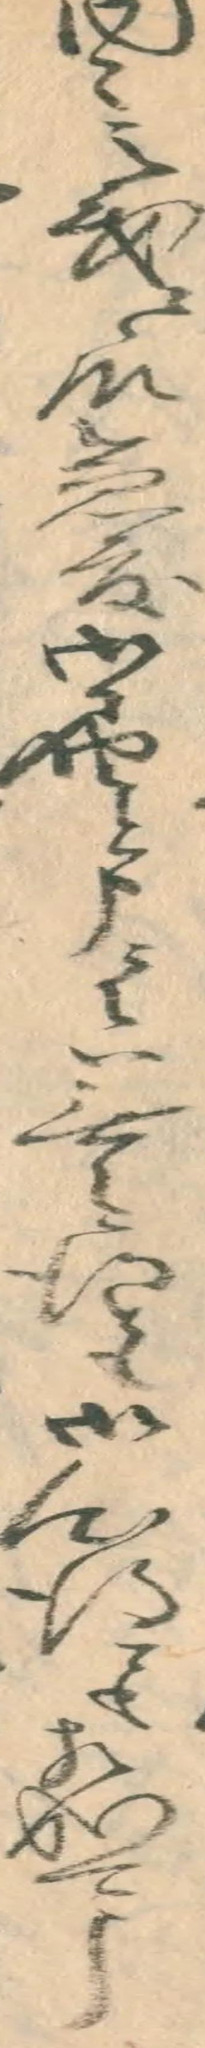内々之義ニ候故急度御届と申ニてハ無之候得とも御心得ニも相成可申
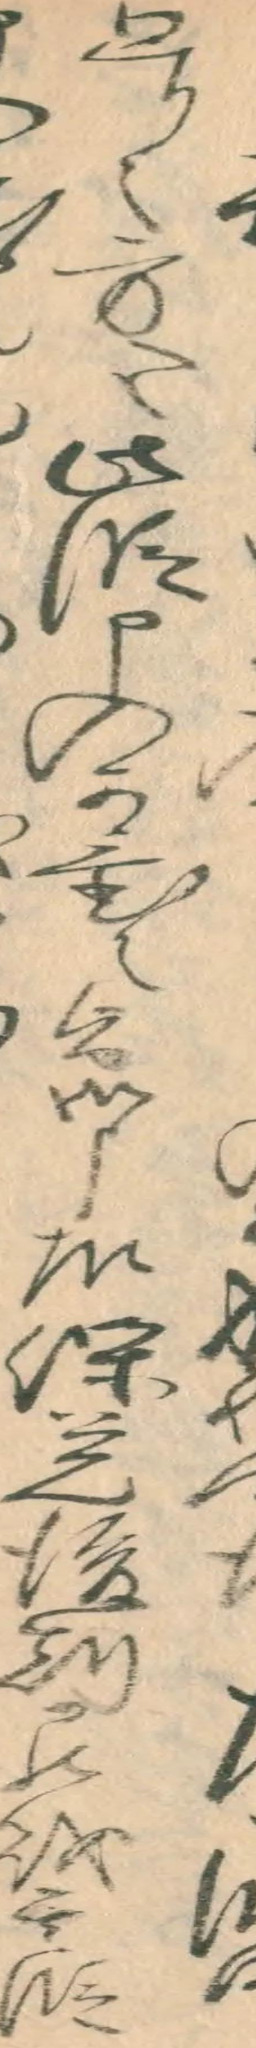廻り之方へも此段申入可置之旨御申故保覚後刻罷越其段
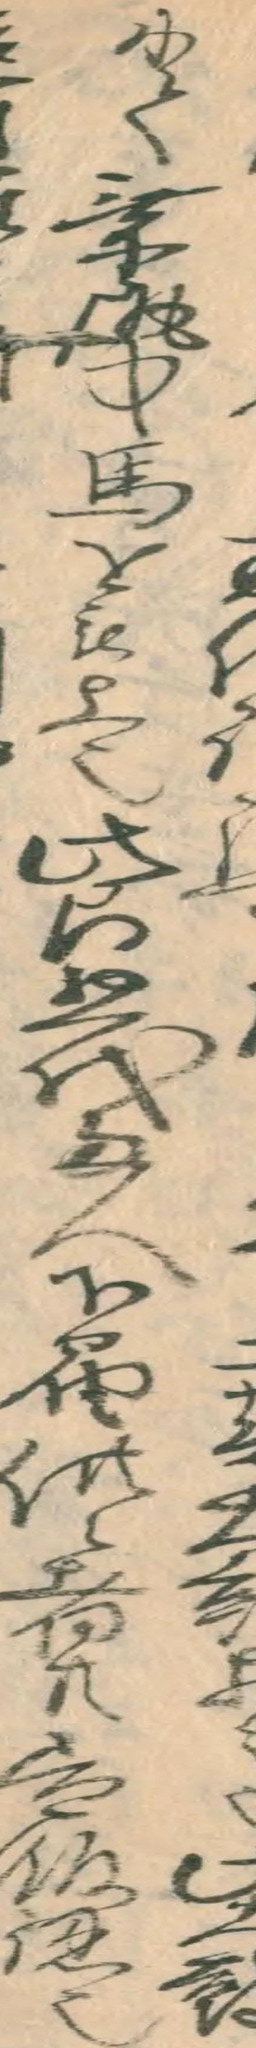にて乗尻中馬を被上也此間惣代両人下宿供之者共昼飯認也
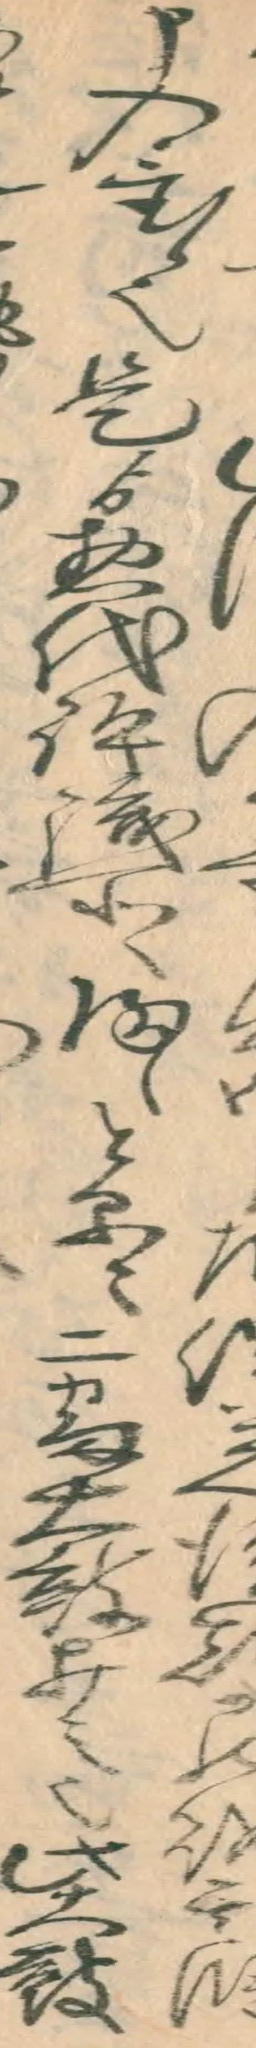申入置候也是ゟ惣代評議所へ帰候と早々二番大鼓打之也此大鼓
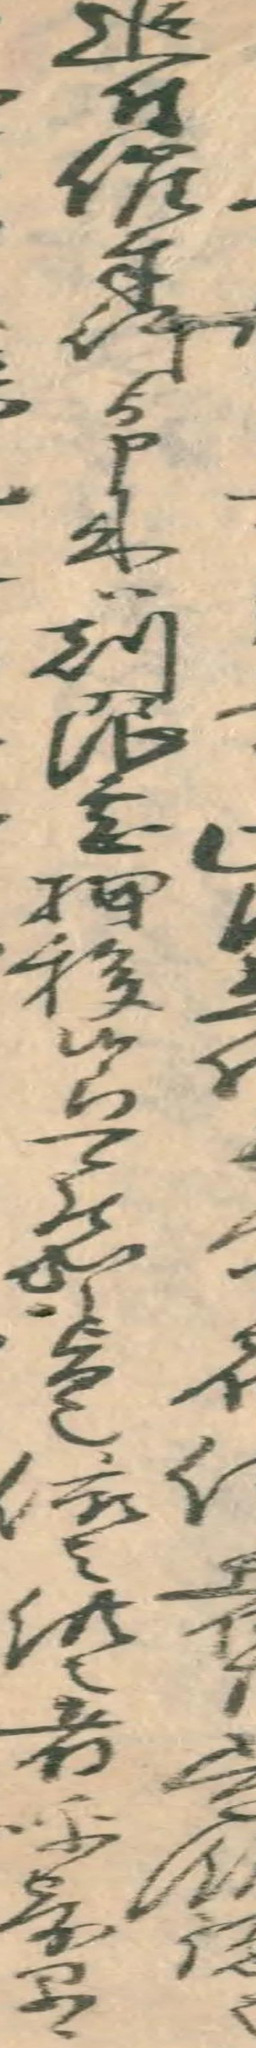追付催奉行ゟ申来ハ刻限甚押移候間可被出候旨也依之供之者呼寄早々
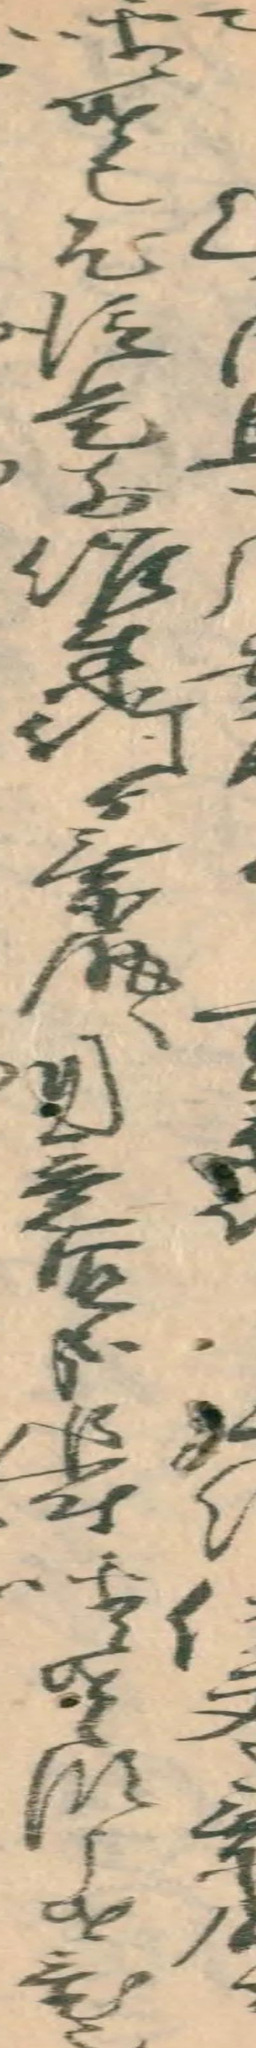呼ニ遣候也尤従是前催奉行ゟ乗尻へ用意宜哉追付呼ニ遣候段申遣置也
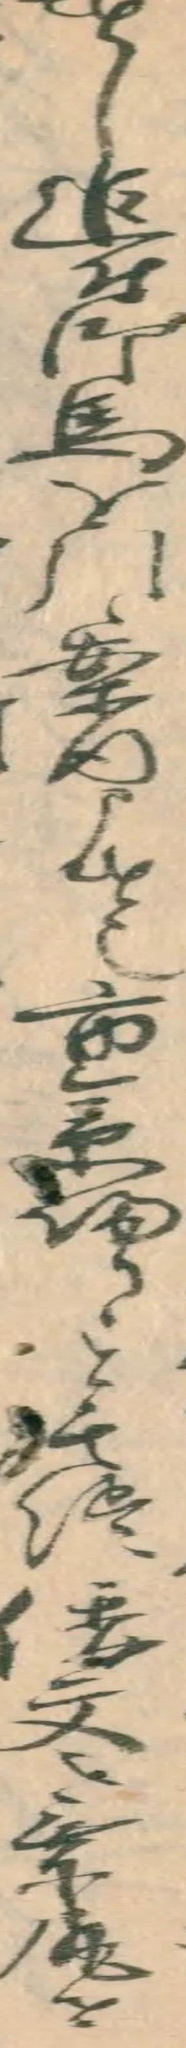遣し追付御馬を引候案内申遣候也市兵衛帰り候と其儘倭文之乗尻を
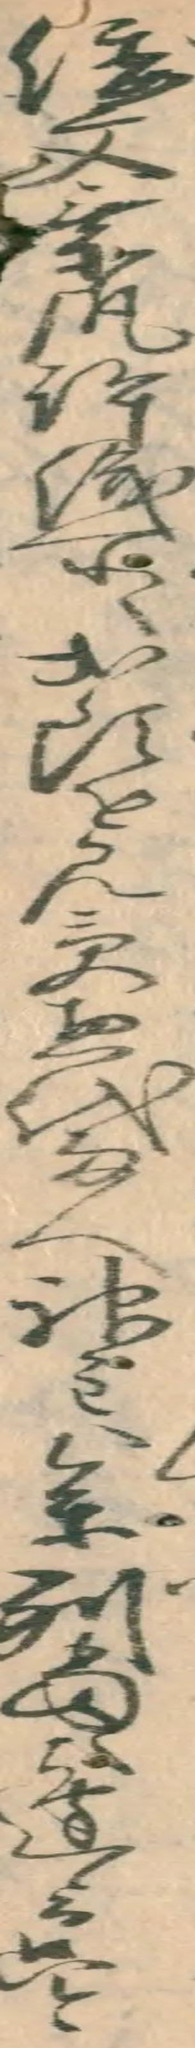倭文乗尻評議所へ出頭を見受惣代両人神主へ参別当へ逢候而只今
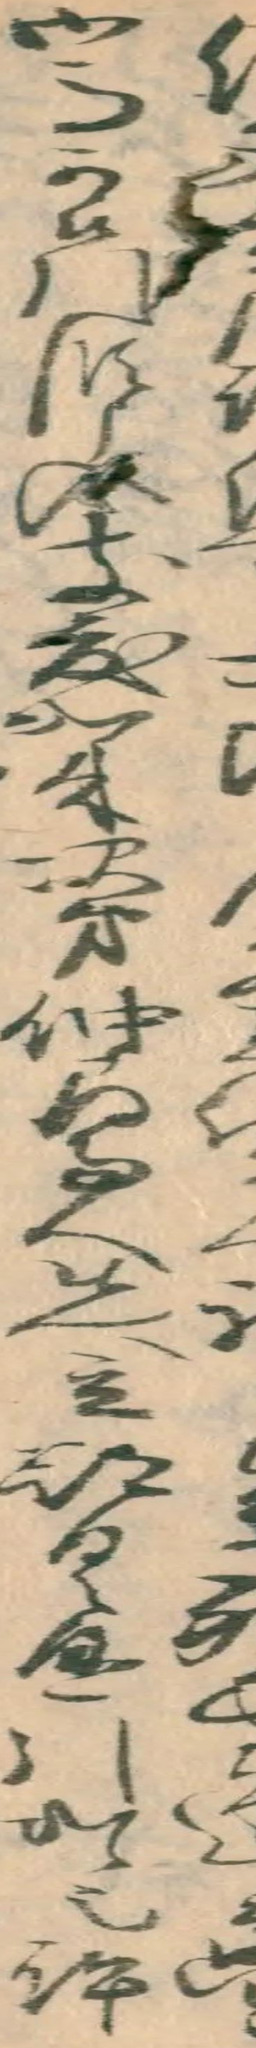御馬可被引段申入支度出来次第仲間両人先へ立朔日之通引出候也評
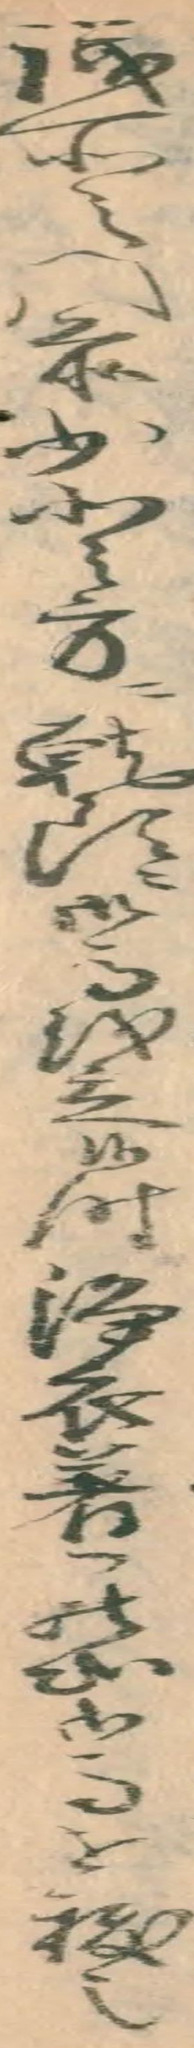議所之門前少北之方ニ乾頭ニ御馬を立候時浄衣着御罷出御馬を祓也
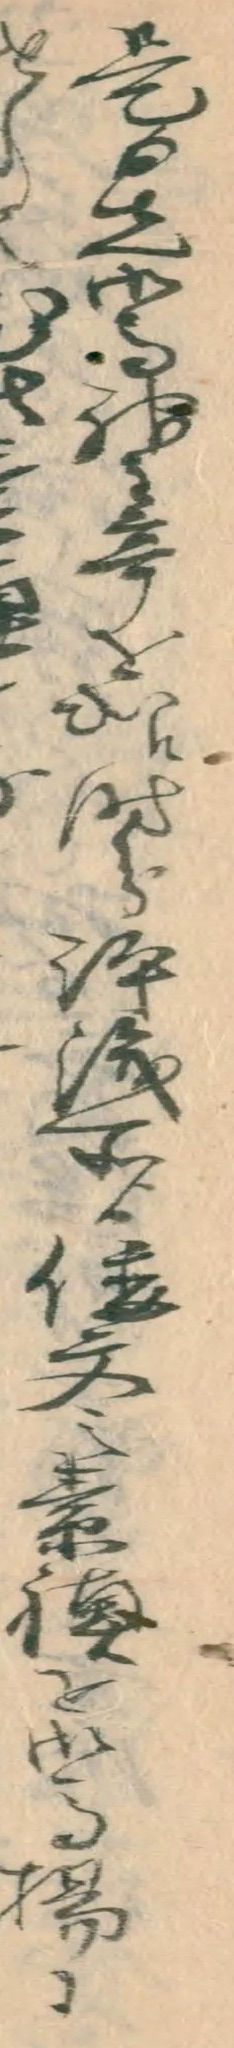是ゟ先御馬神主亭を出ル時分評議所ゟ倭文之素襖を御馬場に
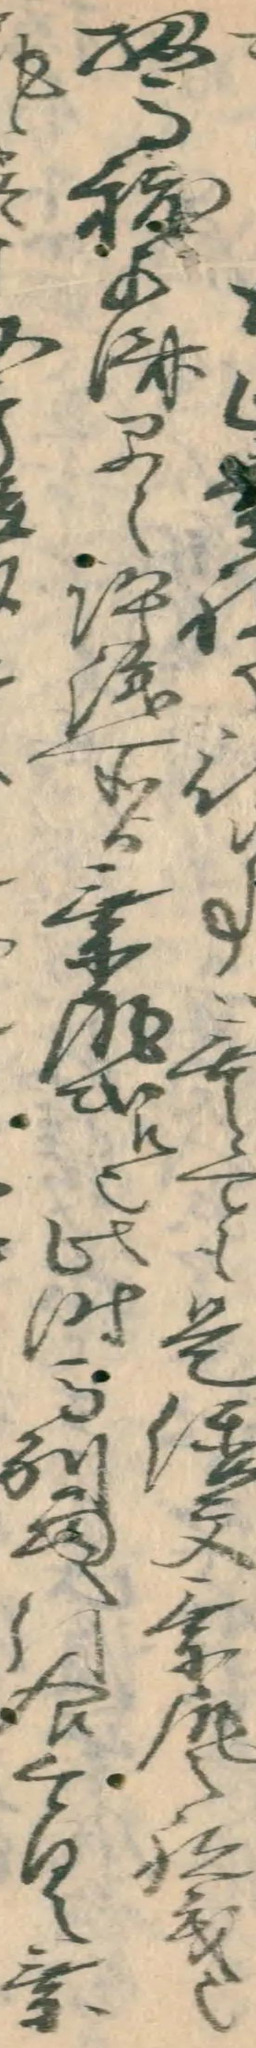扨馬祓相済早々評議所ゟ乗尻出ル也此時馬別当へ引合今日之乗
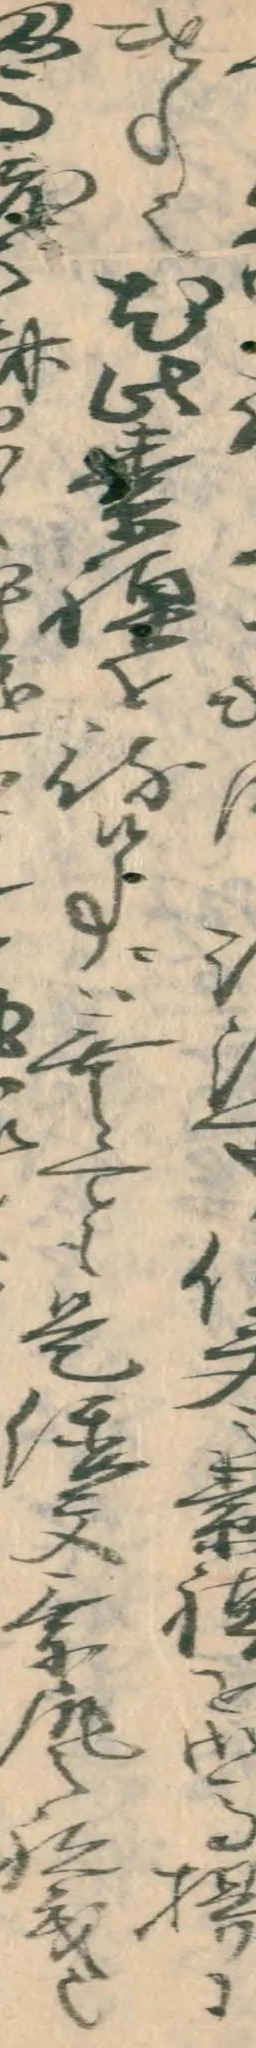遣事也尤此素襖を待候事ニハ無之候へとも是倭文乗尻之祝義也
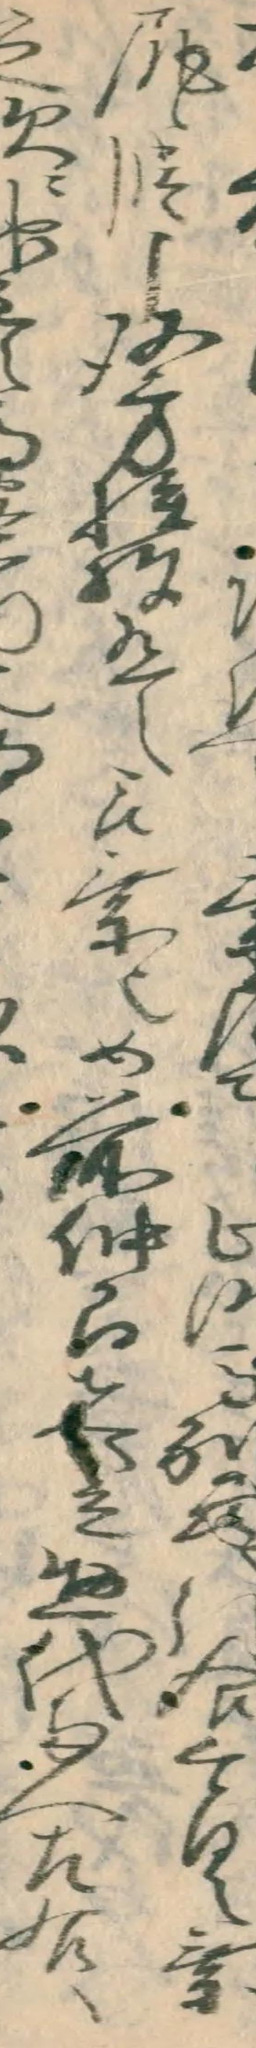尻候段申双方挨拶有之被乗也如前仲間先へ立惣代両人左右へ
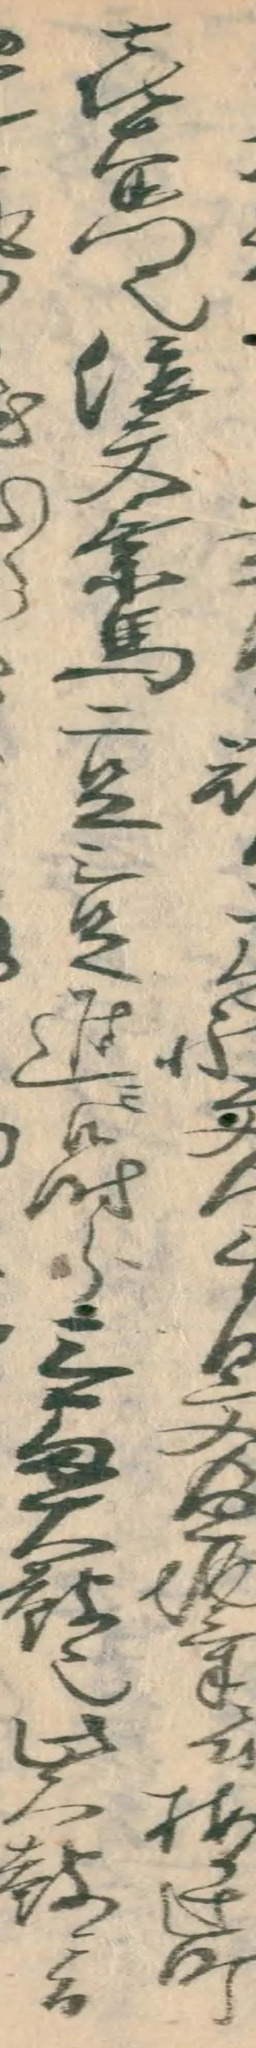喜右衛門也倭文乗馬二足三足進ミ候時分三番大鼓也此大鼓ニ而
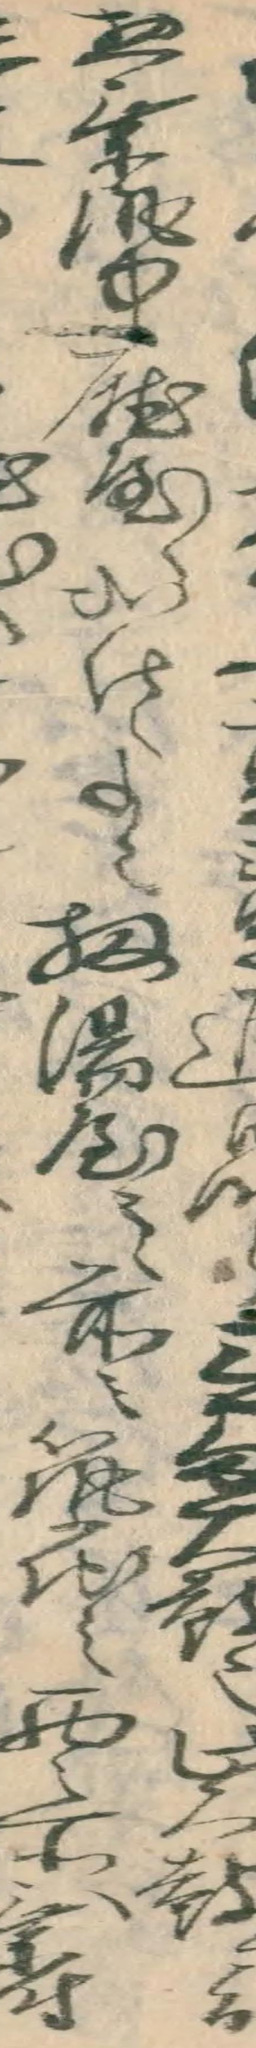惣乗尻中庁屋へ出仕候事也扨湯屋之前之築地之西之所へ乗付
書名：賀茂社記録. 第58冊
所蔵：国立国会図書館 National Diet Library, JAPAN
